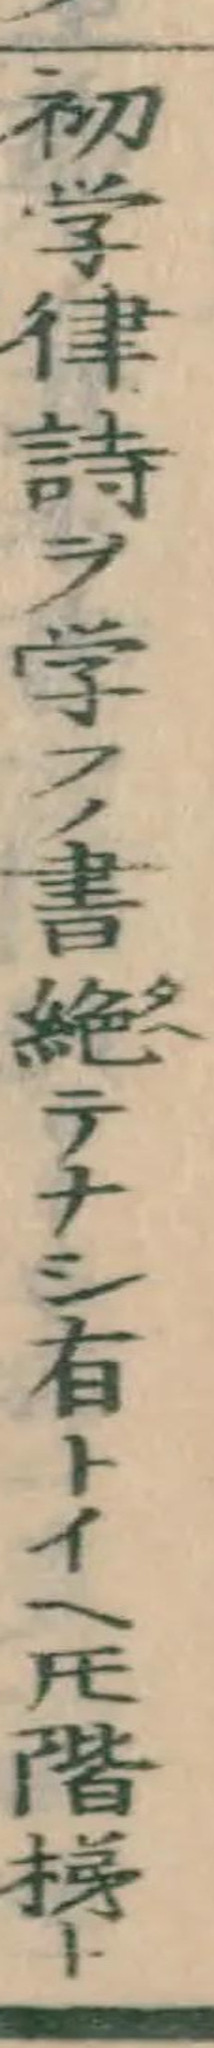初学律詩ヲ学フノ書絶テナシ有トイヘトモ階梯ト
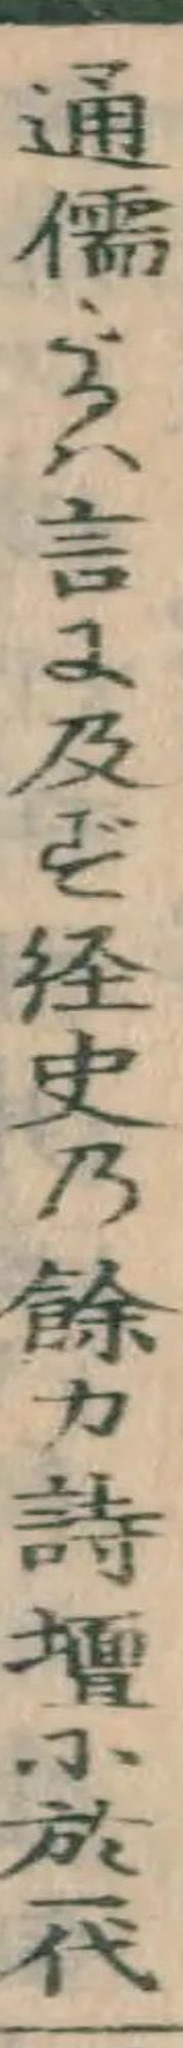通儒たるは言に及ず経史の余力詩壇に於一代
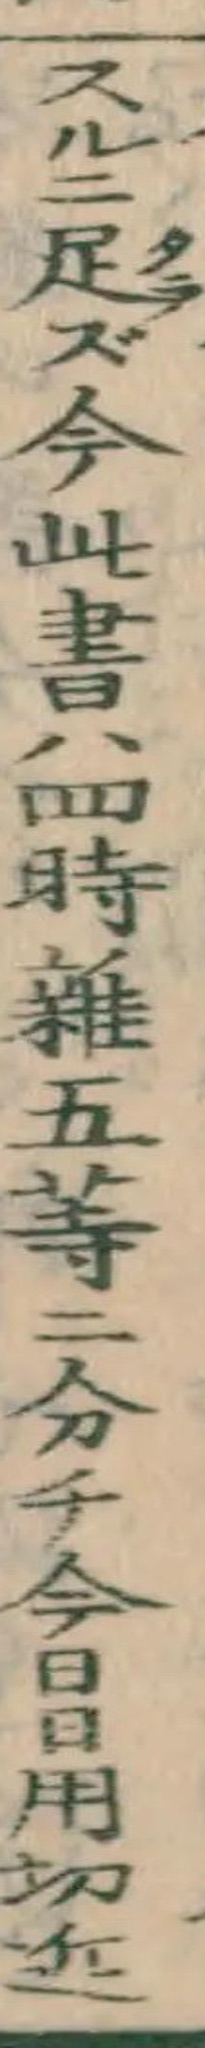スルニ足ズ今此書ハ四時雑五等ニ分チ今日日用切近
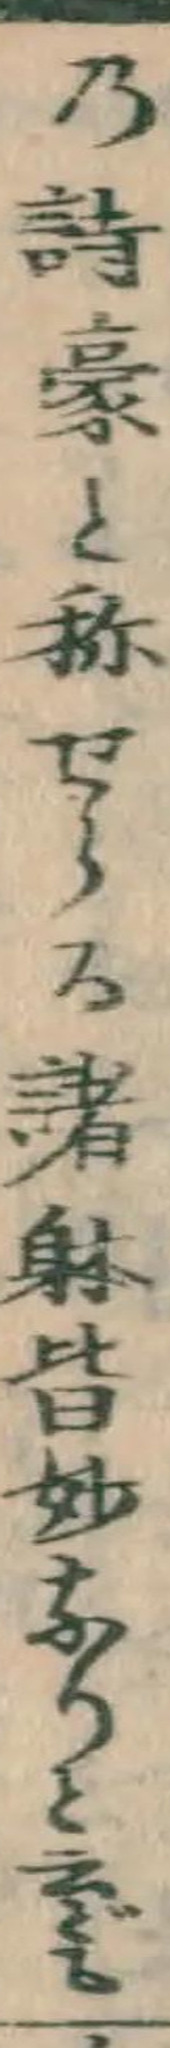の詩豪と称せらる諸体皆妙なりと云ども
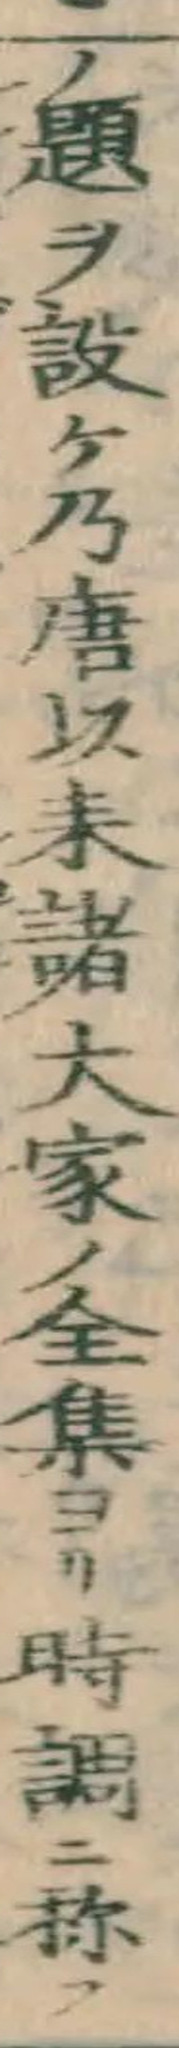ノ題ヲ設ケ乃唐以来諸大家ノ全集ヨリ時調ニ称フ
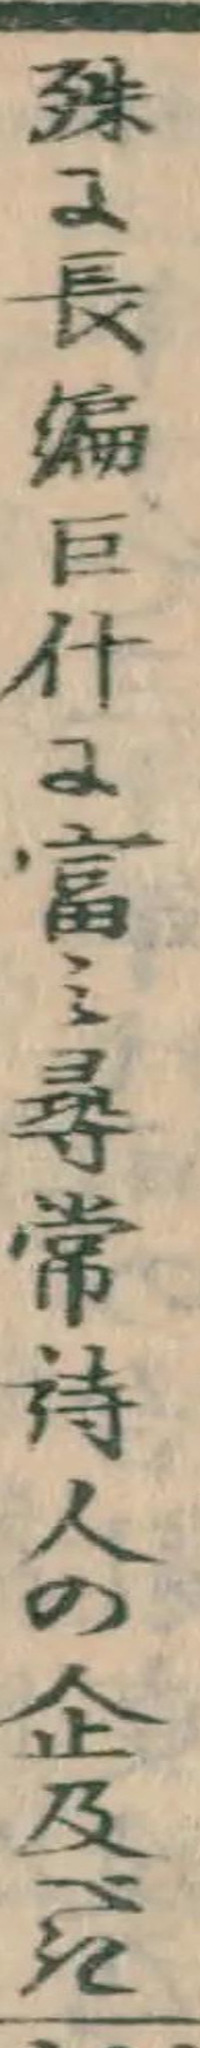殊に長編巨什に富み尋常詩人の企及べき
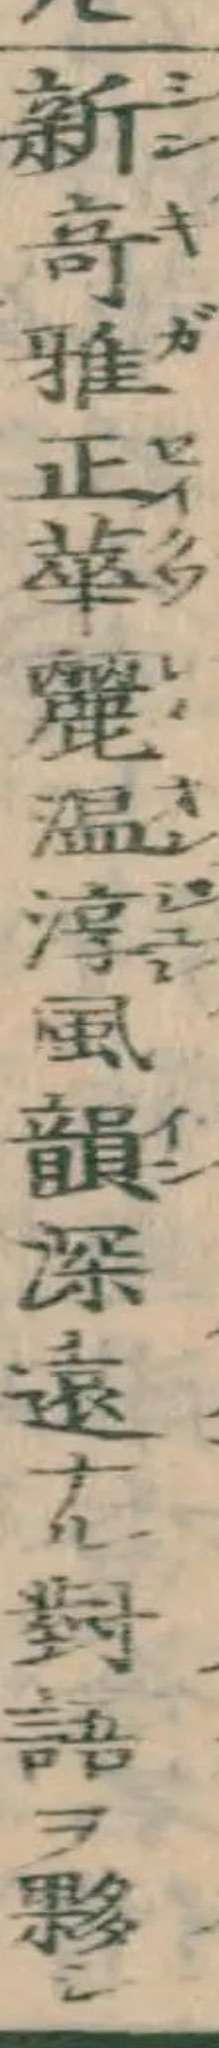新奇雅正華麗温淳風韻深遠ナル対語ヲ夥シ
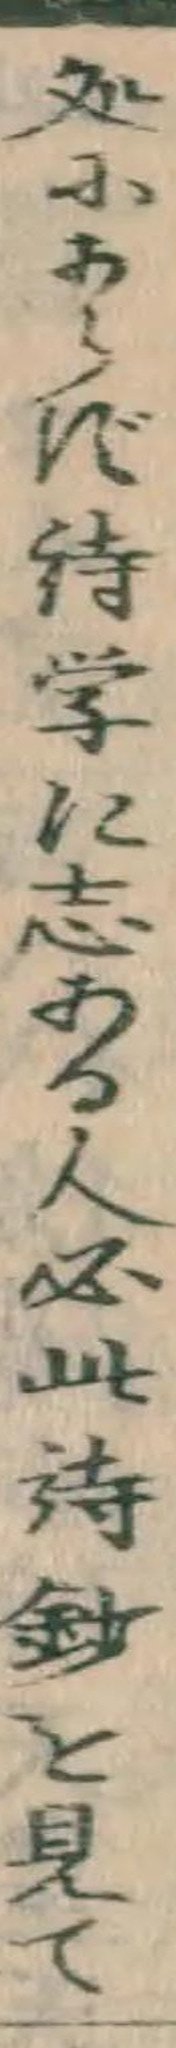処にあらず詩学に志ある人必此詩鈔を見て
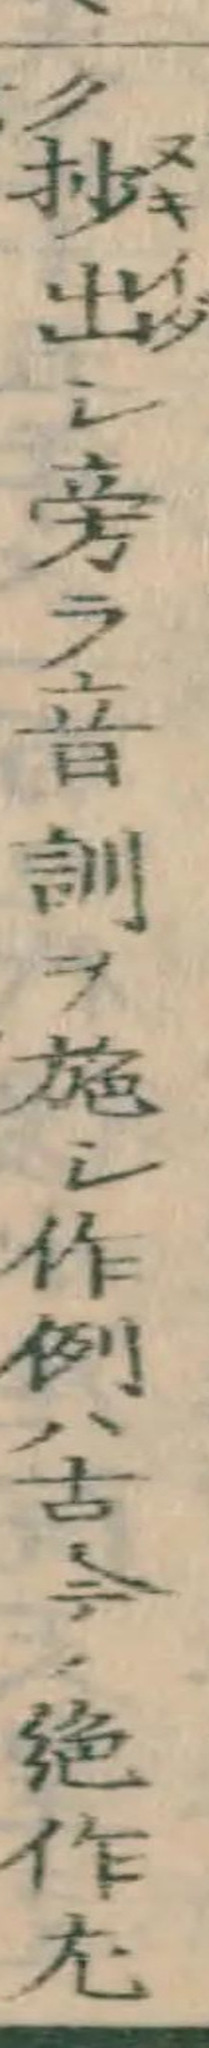ク抄出シ旁ラ音訓ヲ施シ作例ハ古今ノ絶作尤
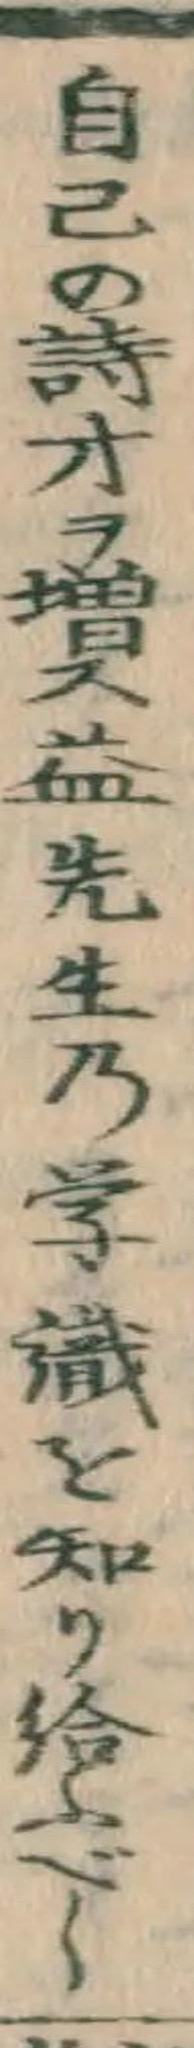自己の詩才を増す益先生の学識を知り給ふべし
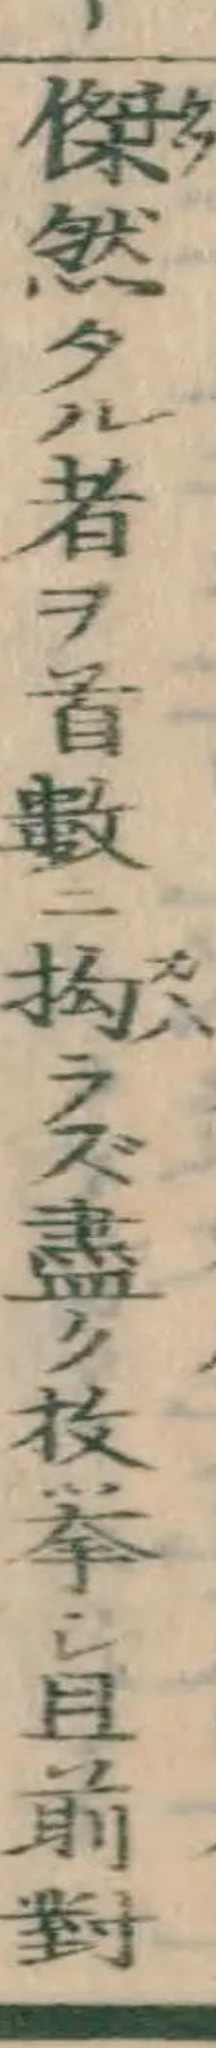傑然タル者ヲ首数ニ拘ラズ尽ク枚挙シ且前対
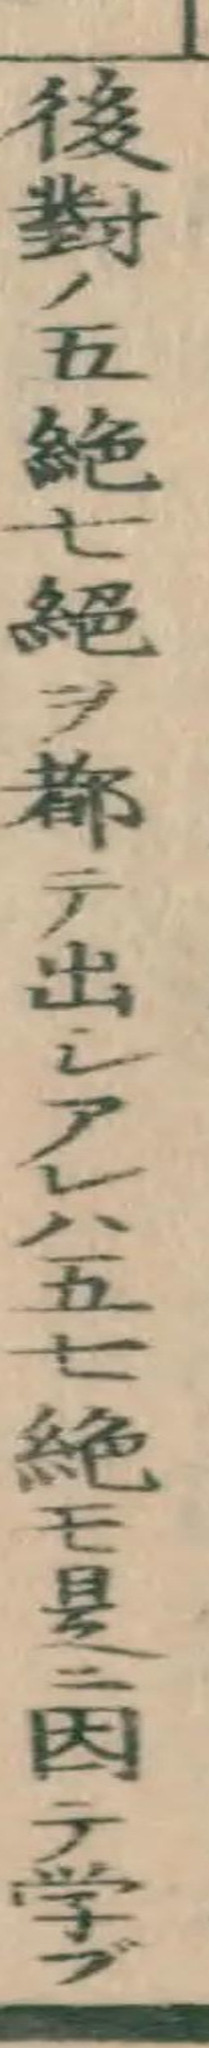後対ノ五絶七絶ヲ都テ出シアレハ五七絶モ是ニ因テ学ブ
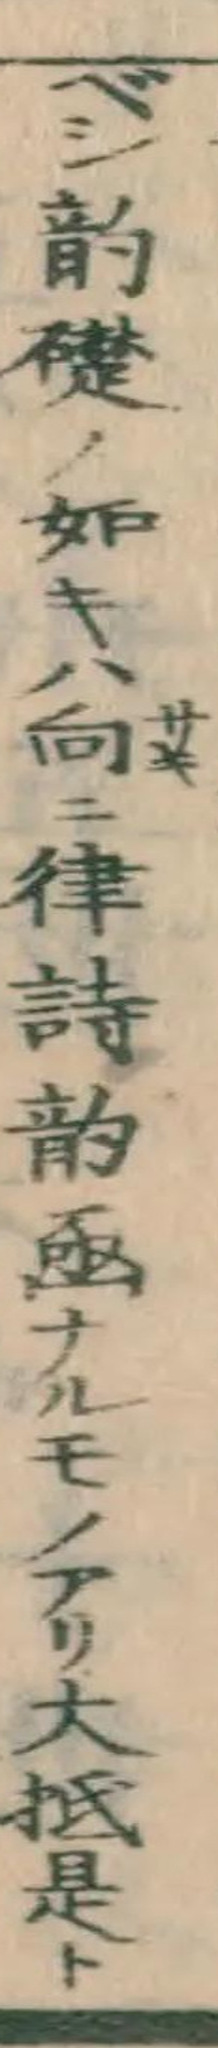ベシ韵礎ノ如キハ向ニ律詩韵函ナルモノアリ大抵是ト
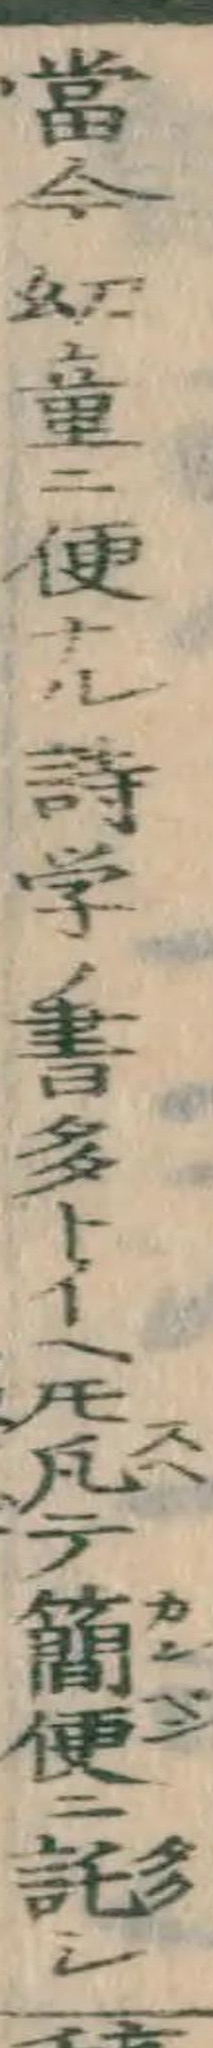当今幼童ニ便ナル詩学ノ書多トイヘトモ凡テ簡便ニ託シ
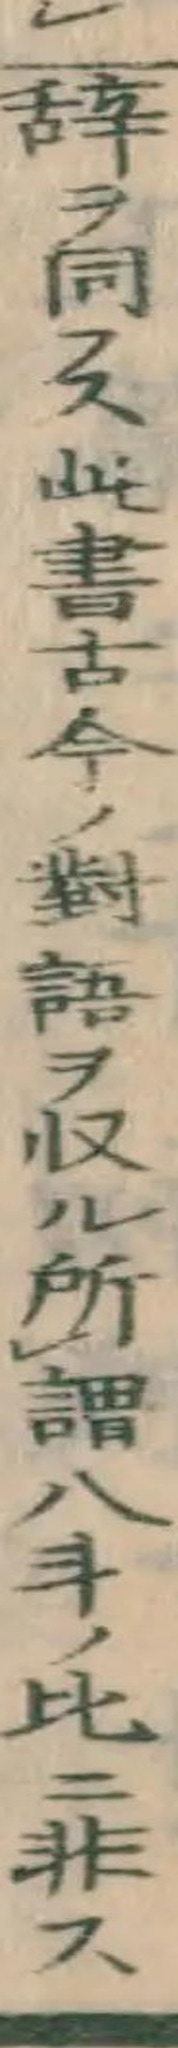辞ヲ同フス此書古今ノ対語ヲ収ル所謂八斗ノ比ニ非ス
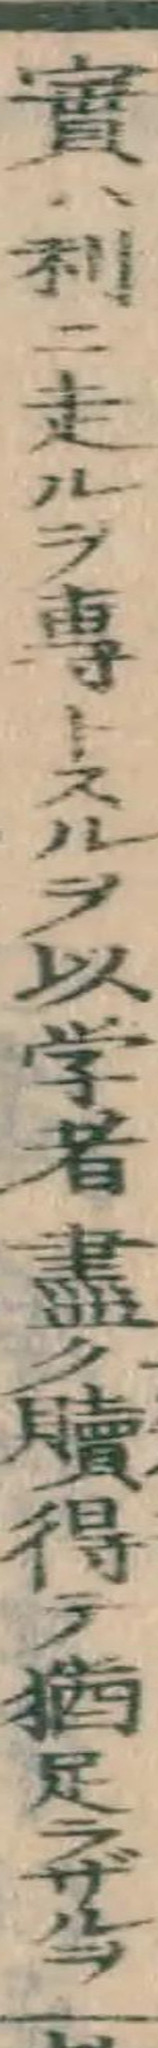実ハ利ニ走ルヲ専トスルヲ以学者尽ク贖得テ猶足ラザルヲ
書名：これこれ草 2巻. [2]
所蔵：国立国会図書館 National Diet Library, JAPAN
